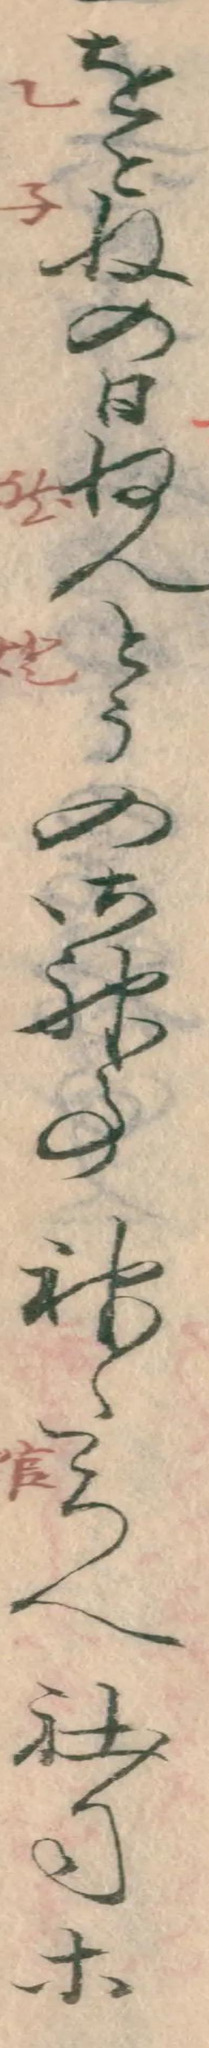一をとねの日ねんとうの御神事神たちへ社司等
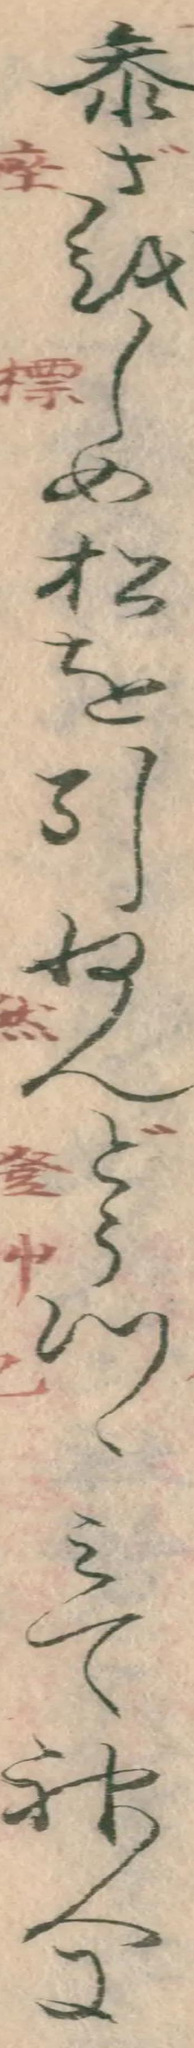参ざをしめ松を引ねんどうつゝみて神人に
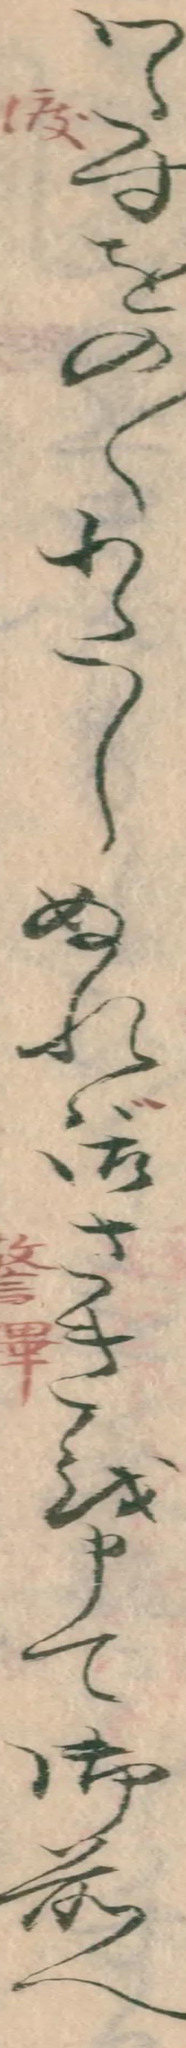わたすをの〳〵わたしぬれば御さきを申て御前へ
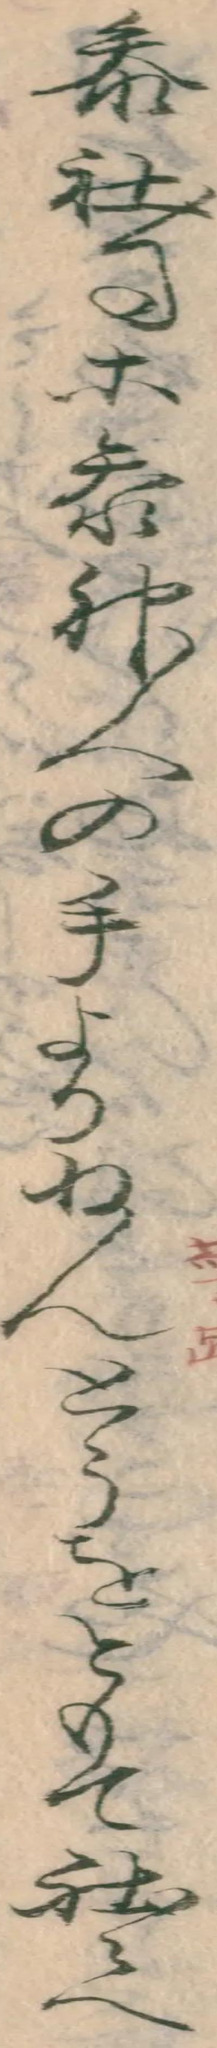参社司等参神人の手よりねんとうをともて社々へ
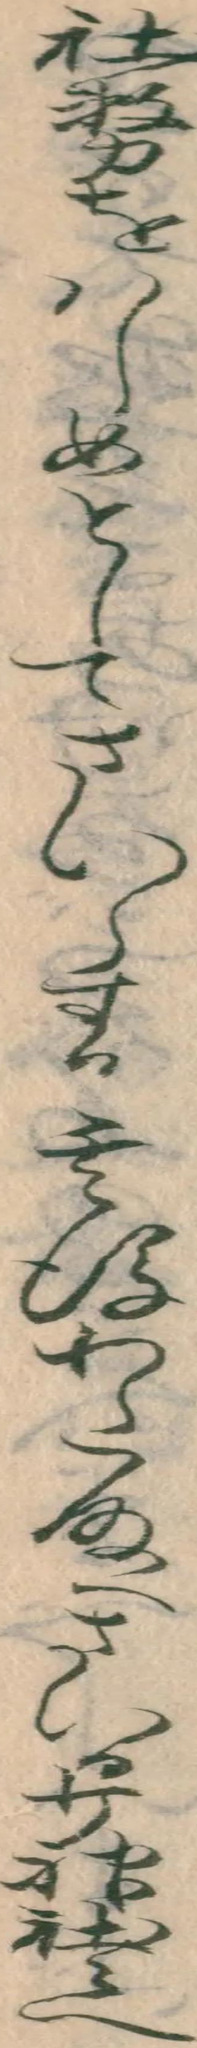社務をはしめとしてまいらする其後わた殿へまいる少神社々へ
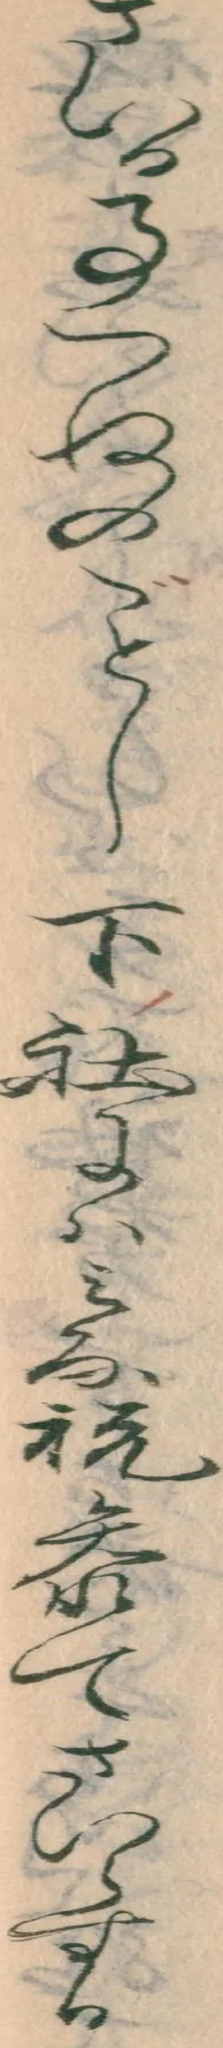まいる事つねのごとし下社にはみな祝参てまいらする
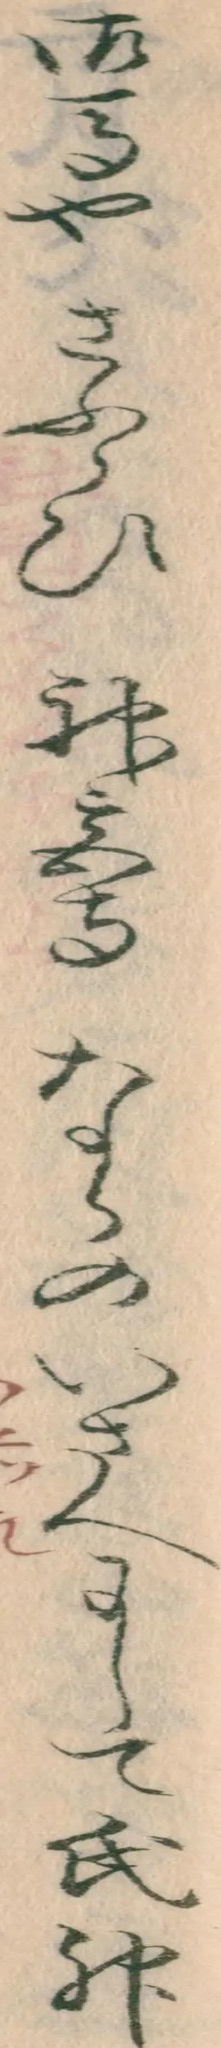御馬やさふらひ神宮寺ならのいまへにして氏神
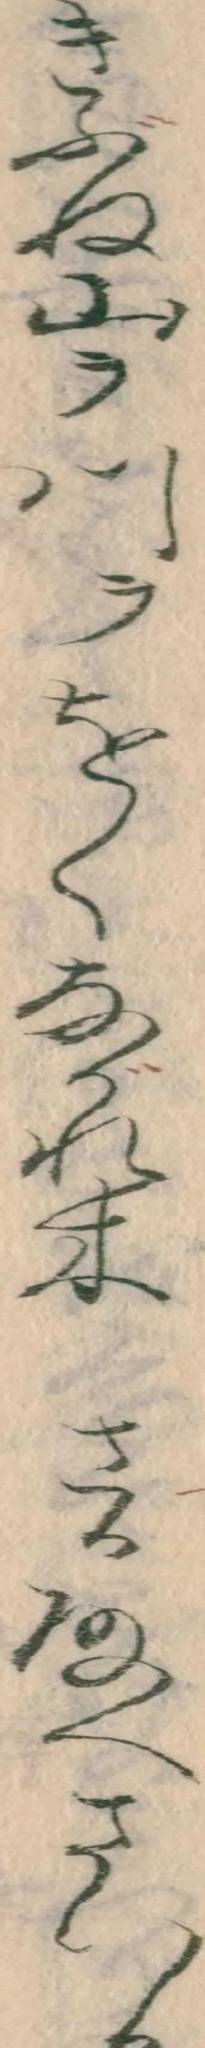きぶね山を川ををくながれ木さか殿へまいる
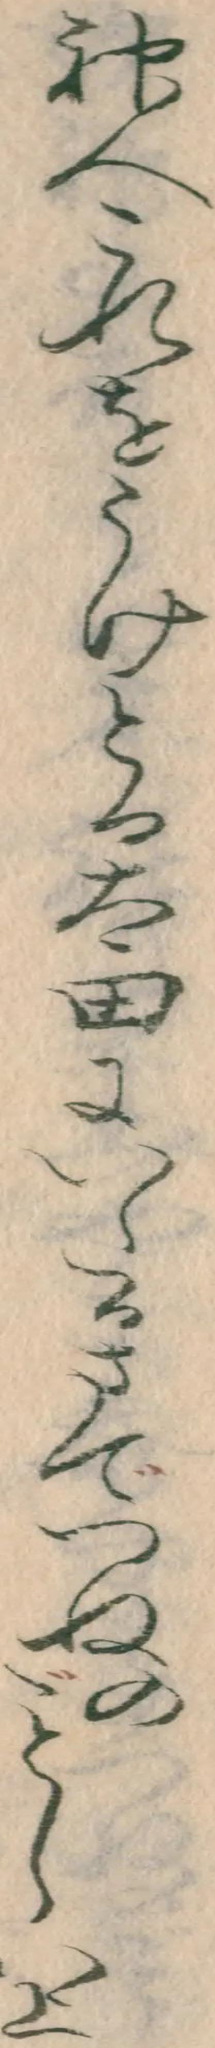神人これをうけとる太田にいたるまでつねのごとしい上

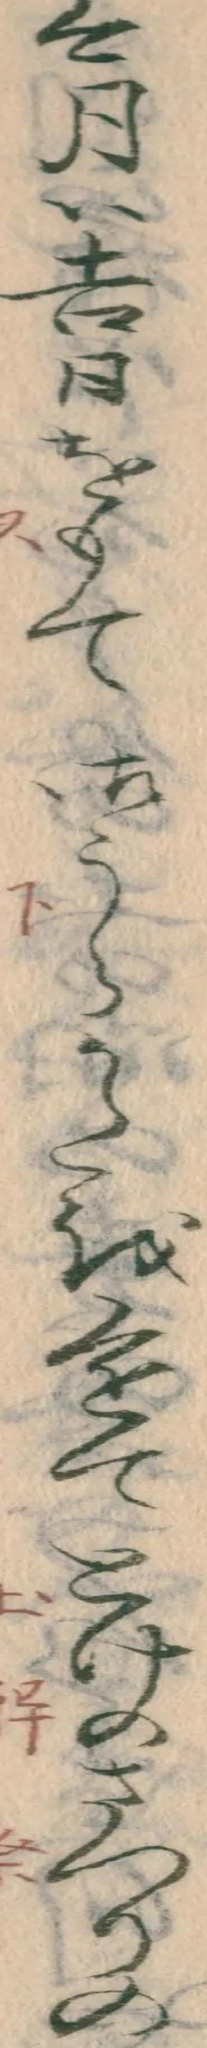今月は吉日をもて御うらかたを進てとけのまつりの
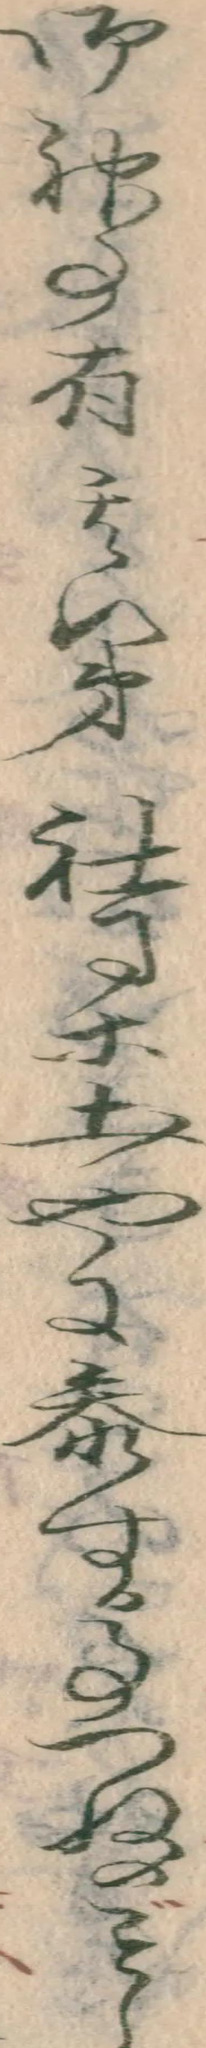御神事有其次第社司等土やに参する事つねのごとし
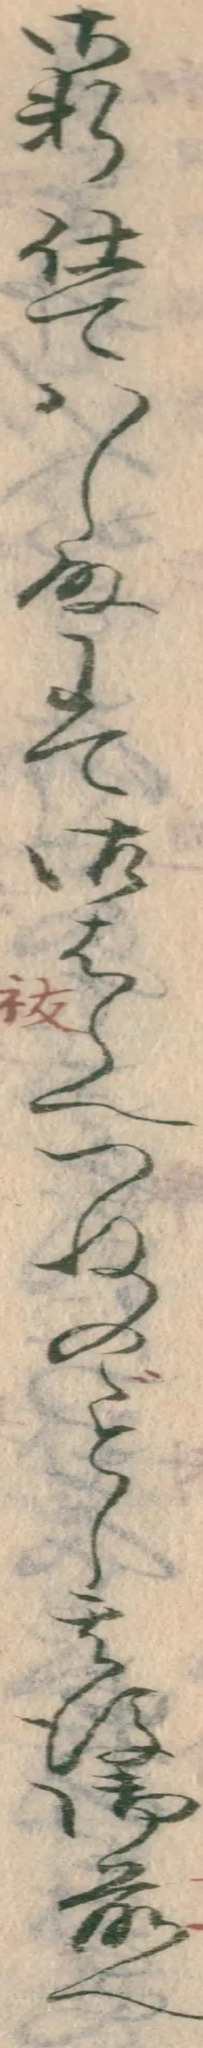御料仕てはし殿にて御はらへつねのごとし其後御前へ
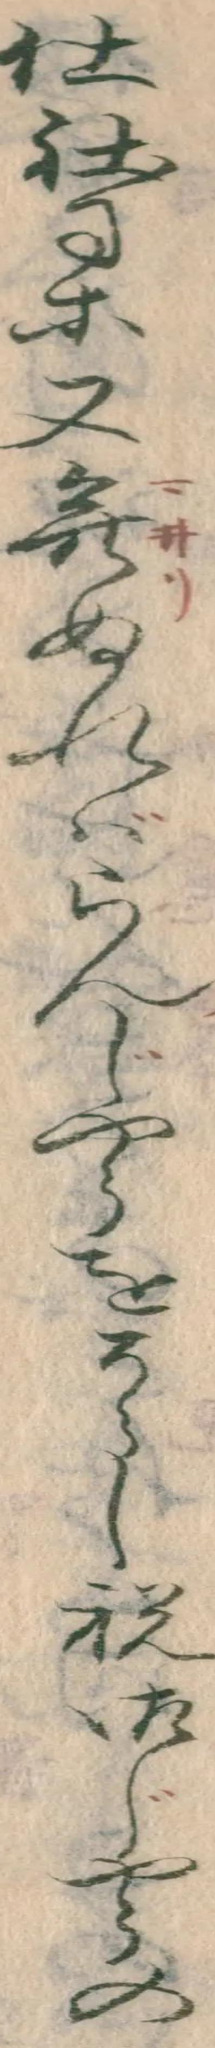仕社司等又参ぬればらんじやうをそうし祝御じやうの
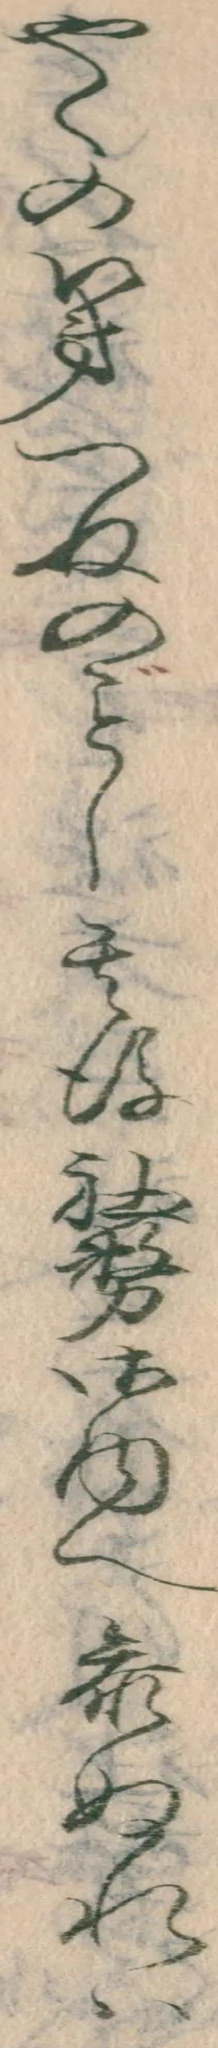やくの次第つねのごとし其後社務御内へ参ぬれは
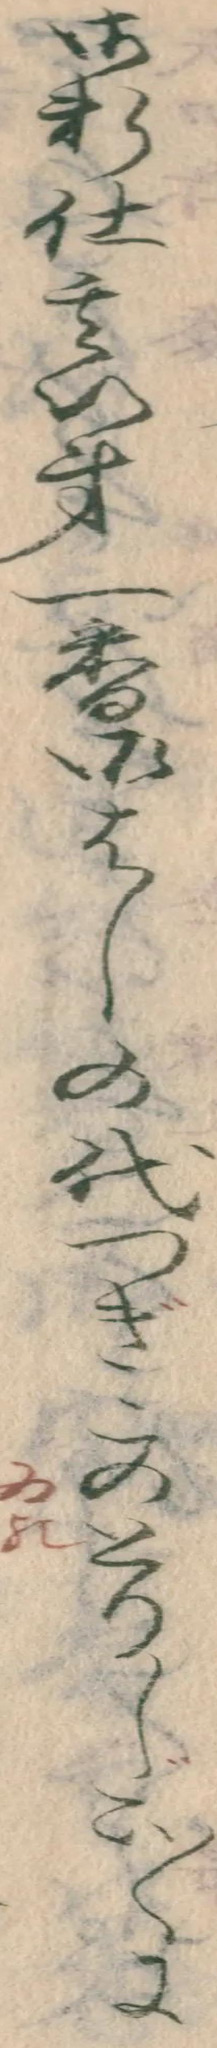御料仕其次第一番御はしの代つぎこのとりしだい〳〵に
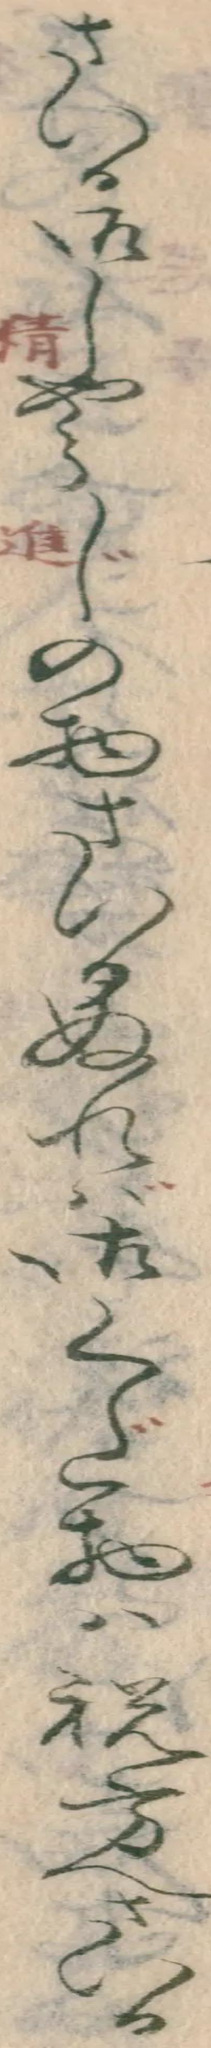まいる御しやうじの物まいりぬれば御くだ物は祝方へまいる
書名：賀茂社記録. 第3冊
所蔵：国立国会図書館 National Diet Library, JAPAN
